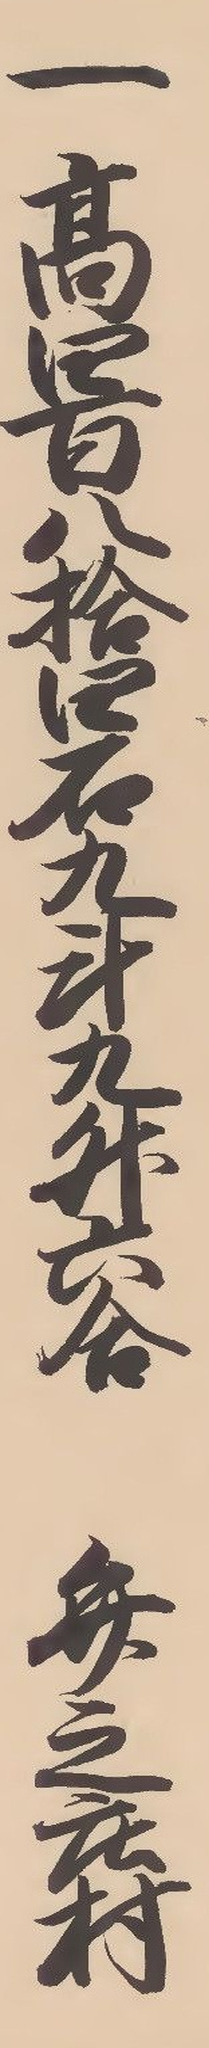一高四百八拾四石九斗九升六合弁之庄村
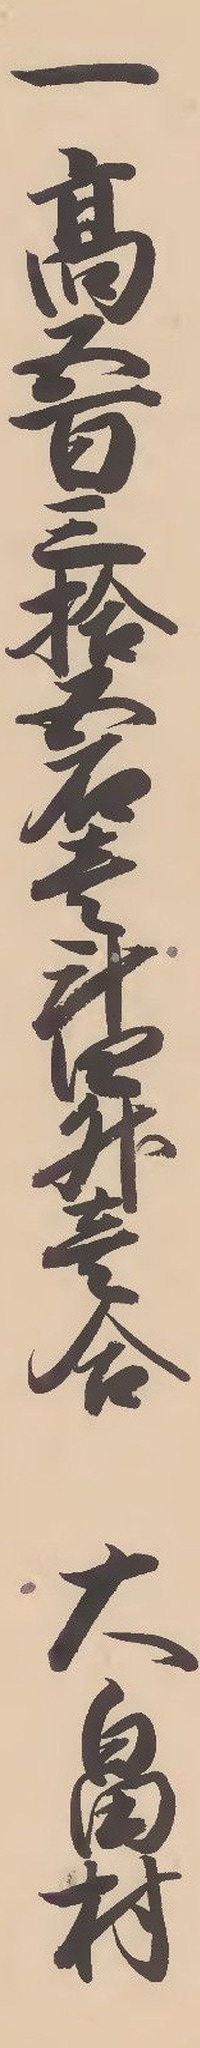一高五百三拾五石壱斗四升壱合大畠村

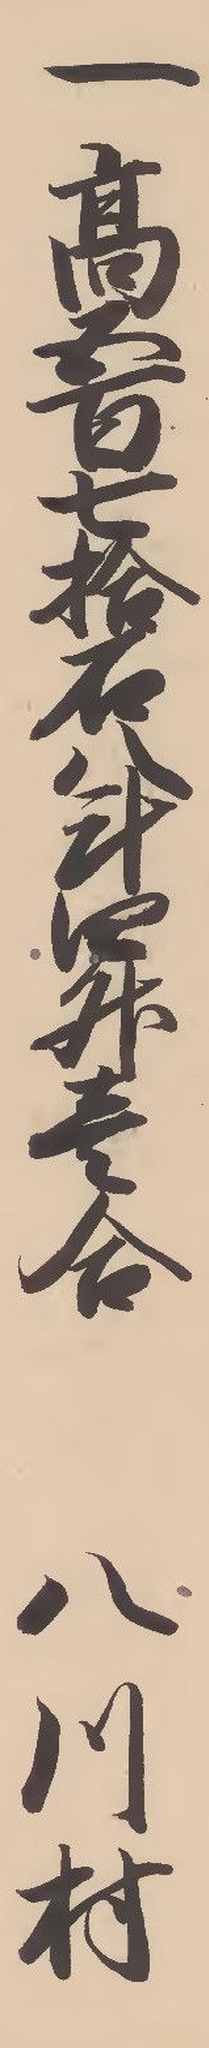一高五百七拾石八斗四升壱合八川村
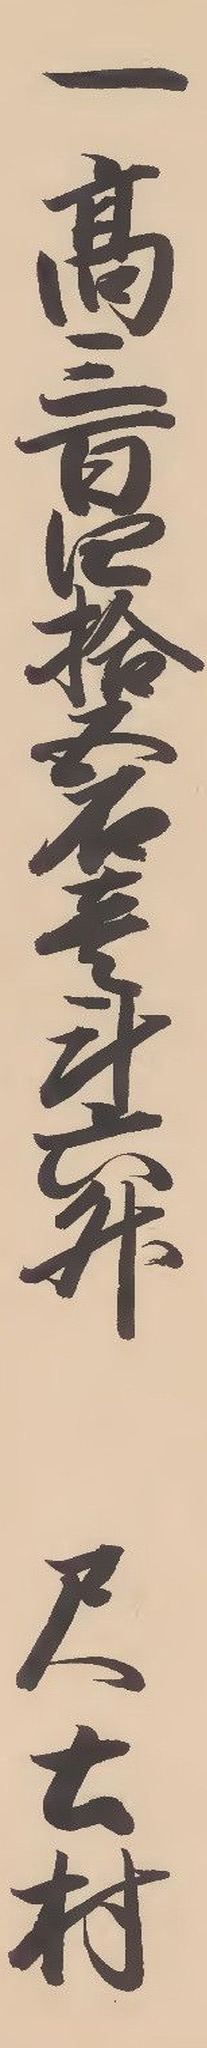一高三百四拾五石壱斗六升尺土村
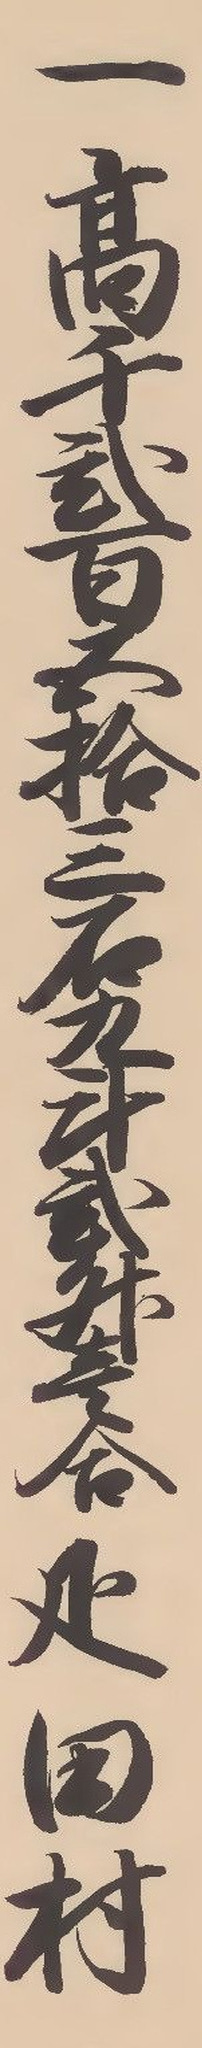一高千弐百五拾三石九斗弐升壱合疋田村
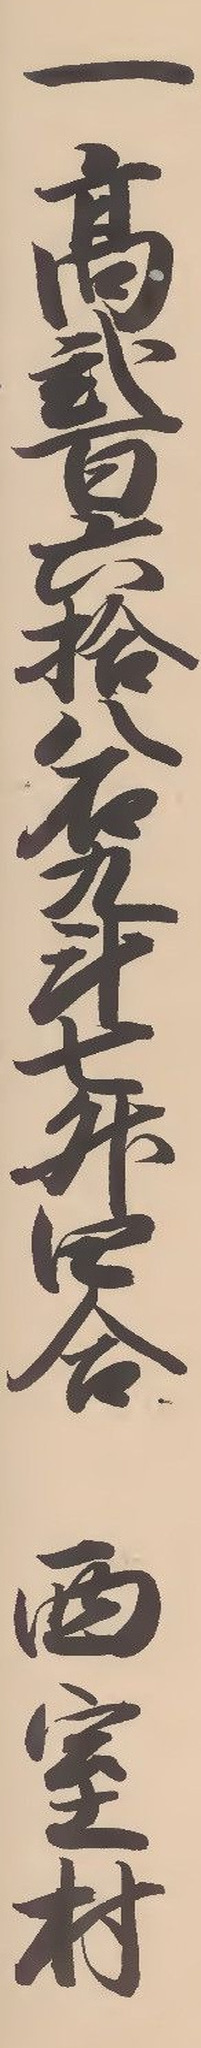一高弐百六拾八石九斗七升四合西室村
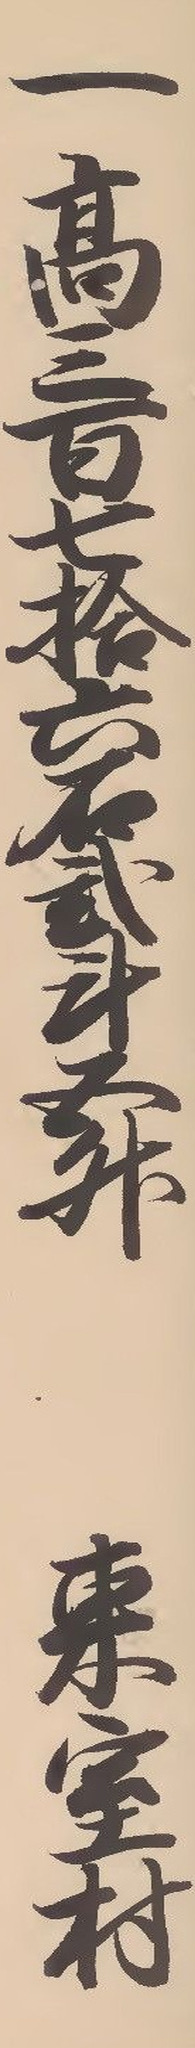一高三百七拾六石弐斗五升東室村
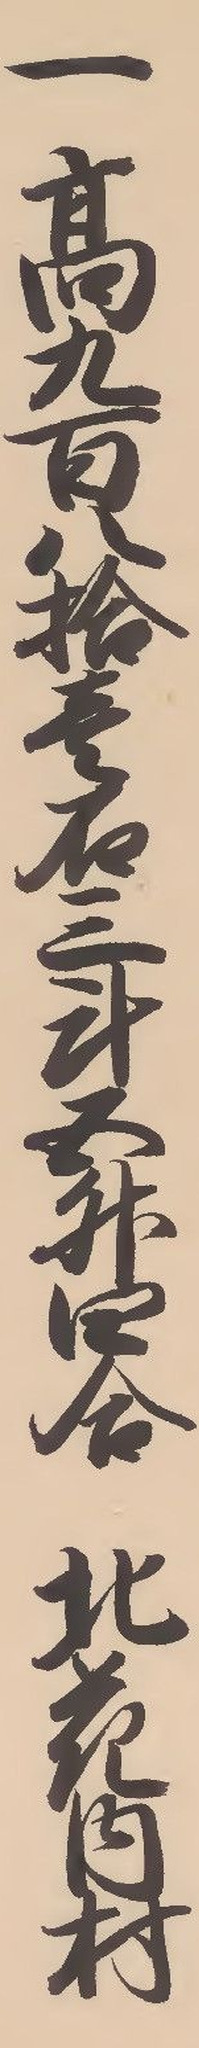一高九百八拾壱石三斗五升四合北花内村
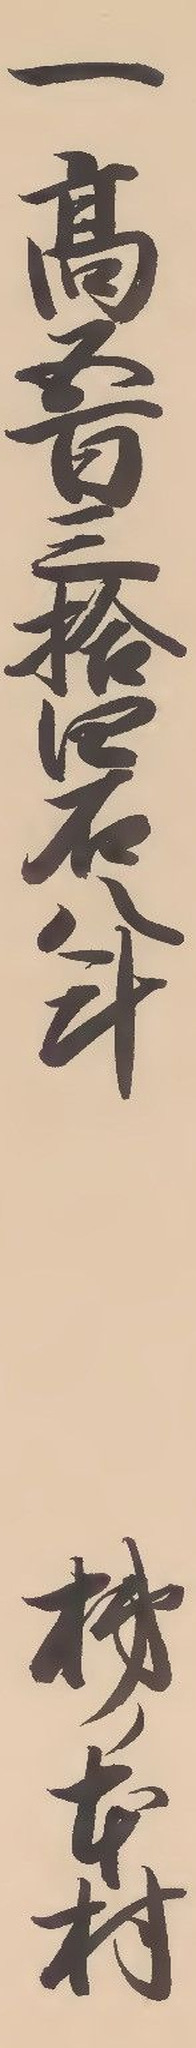一高五百三拾四石八斗柿ノ本村
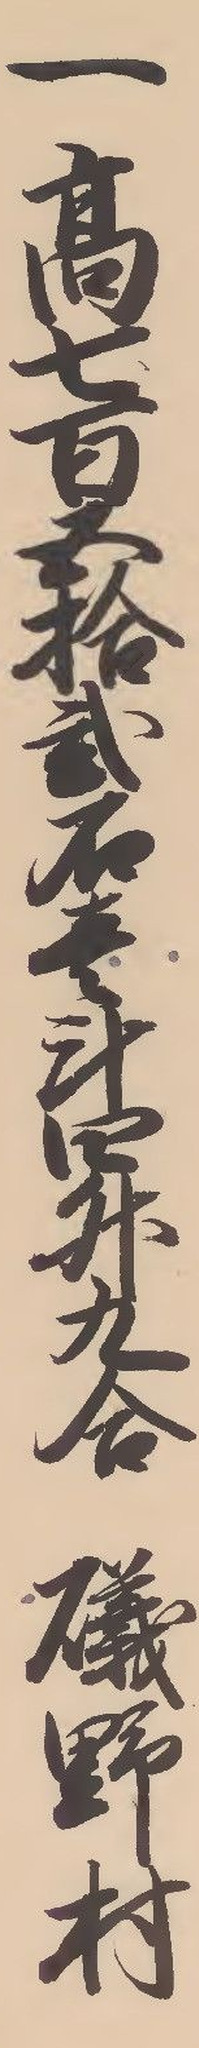一高七百五拾弐石壱斗四升九合磯野村

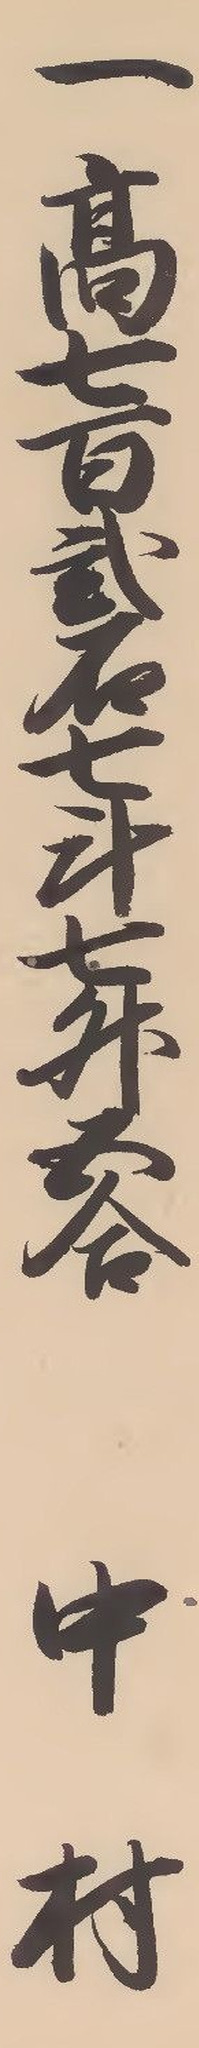一高七百弐石七斗七升五合中村
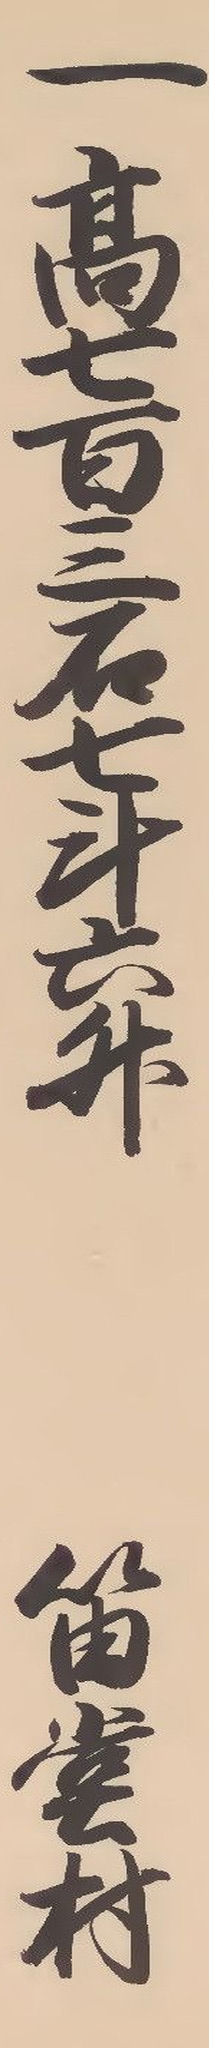一高七百三石七斗六升笛堂村
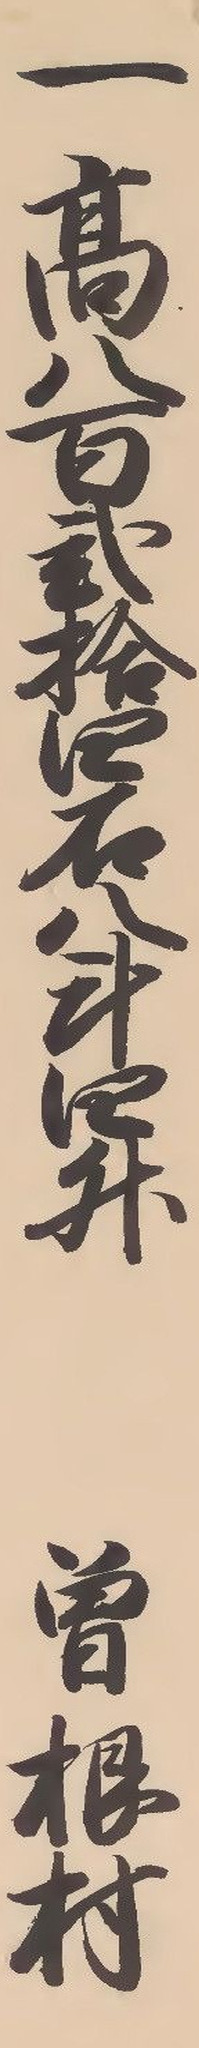一高八百弐拾四石八斗四升曽根村
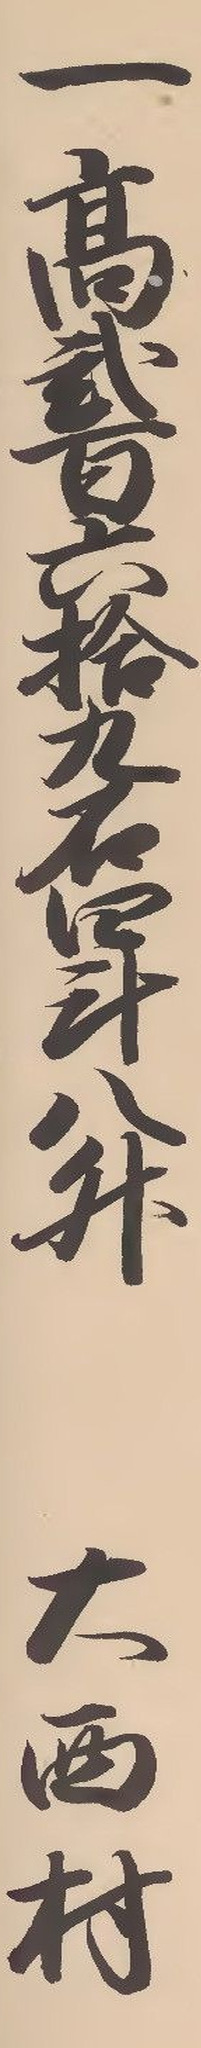一高弐百六拾九石四斗八升大西村
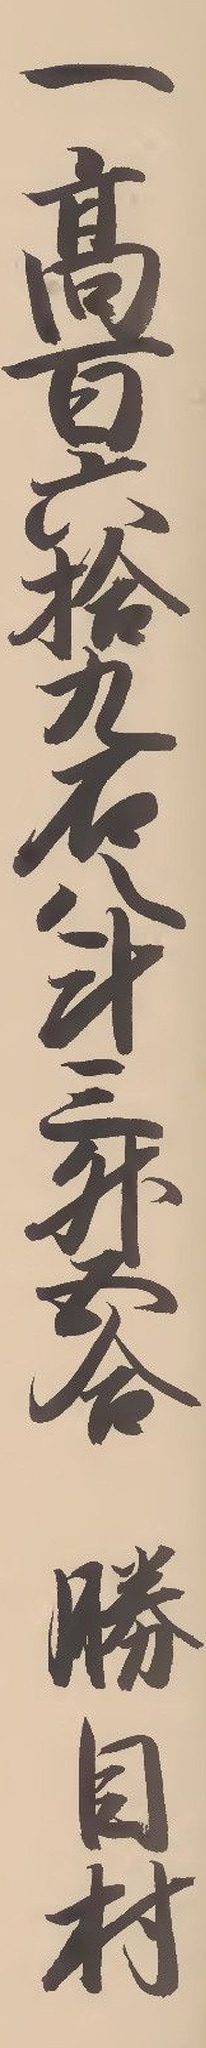一高百六拾九石八斗三升五合勝目村
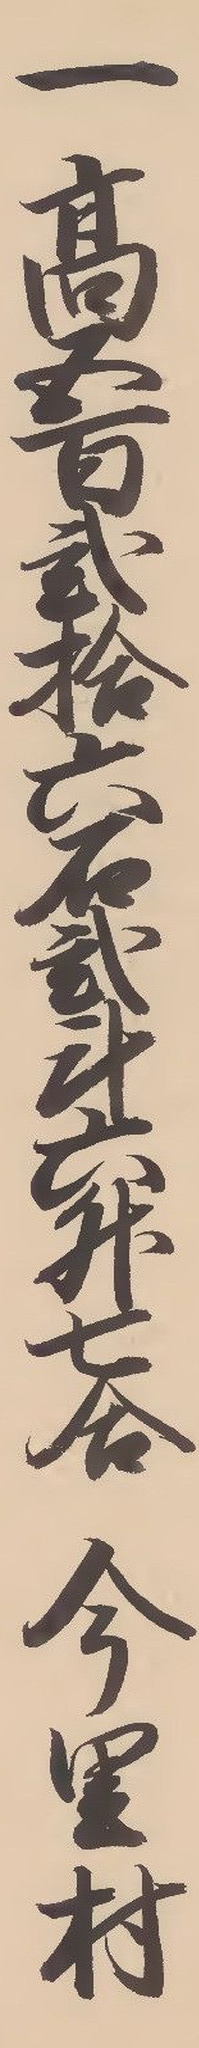一高五百弐拾六石弐斗六升七合今里村
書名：大和国郷帳
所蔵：国立公文書館 National Archives of Japan
